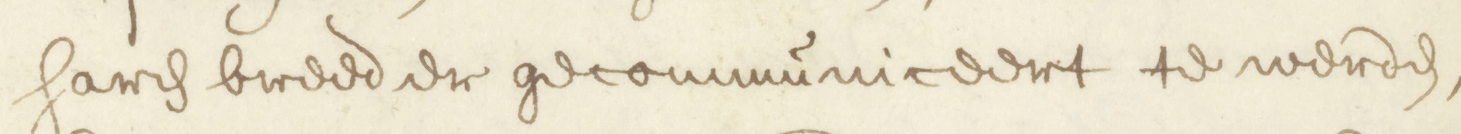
haren breeder gecommuniceert te werden,
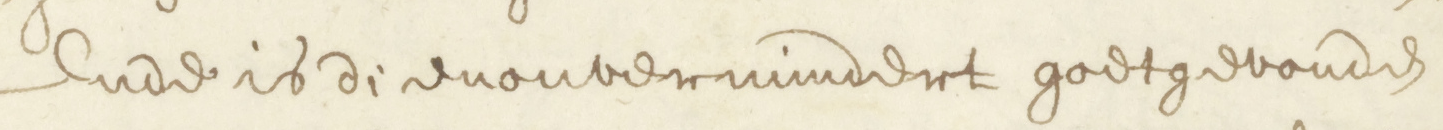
Ende is dienonvermindert goetgevonden
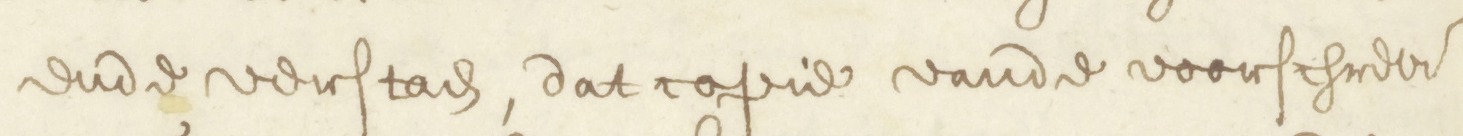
ende verstaen, dat copie vande voorschreve
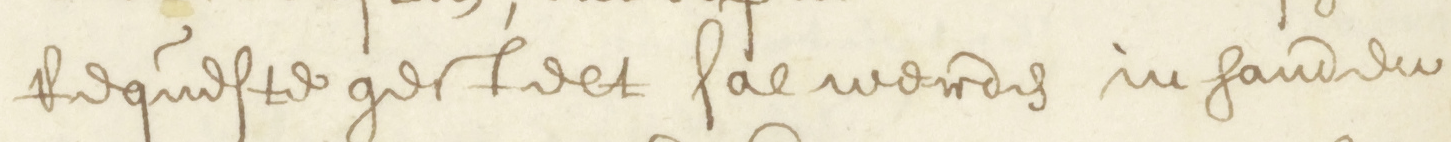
Requeste gestelt sal werden in handen
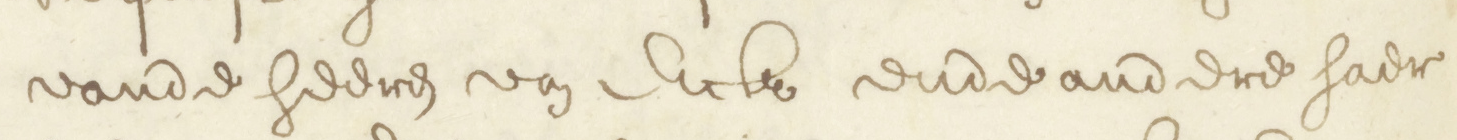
vande heeren van Eck ende andere haer
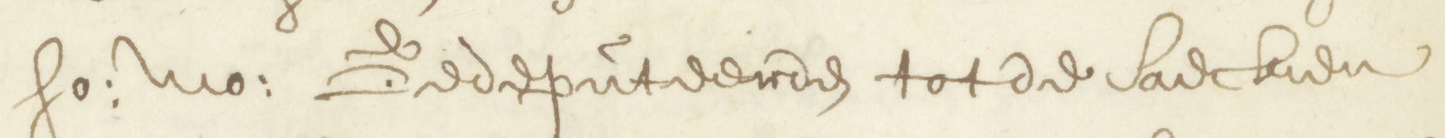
ho:Mo: Gedeputeerden tot de Saecken
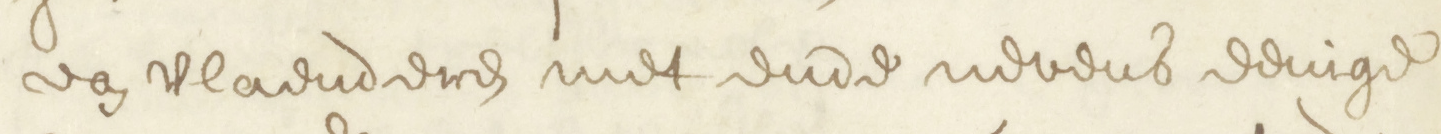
van Vlaenderen met ende nevens eenige
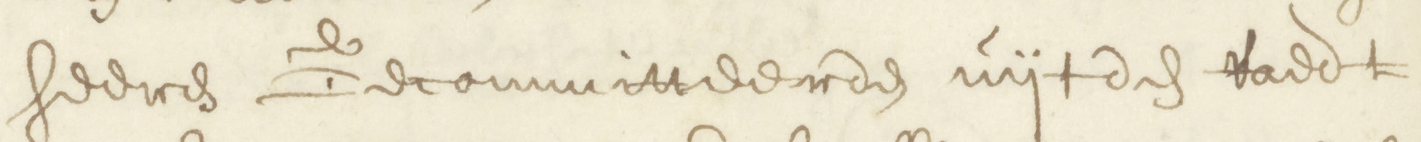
heeren Gecommitteerden uijt den Raedt
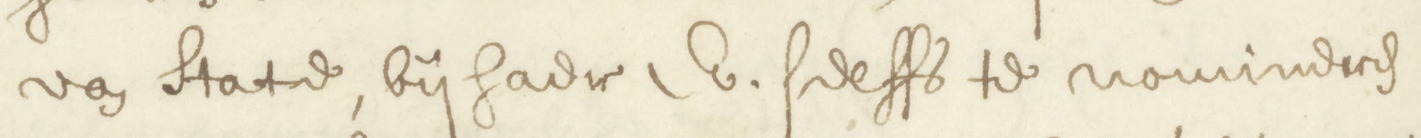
van State, bij haer E. selffs te nomineren
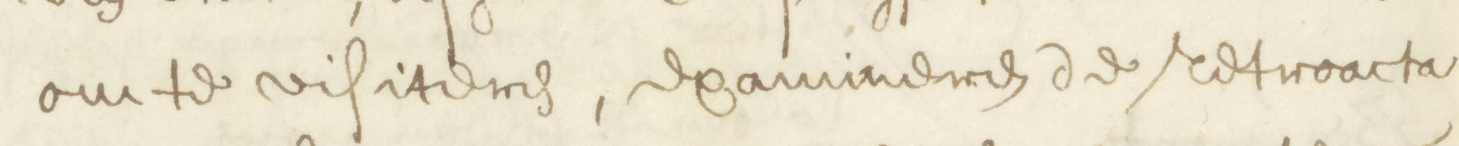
om te visiteren, examineren de retroacta
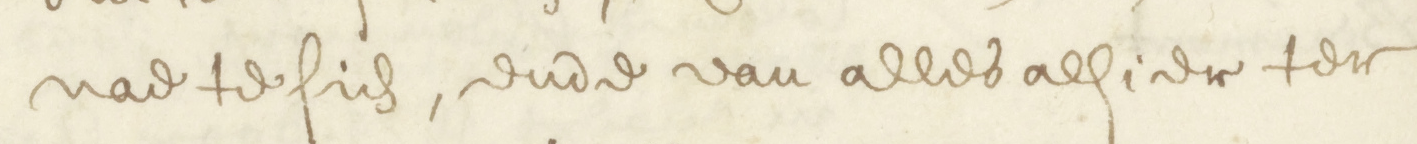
nae te sien, ende van alles alhier ter
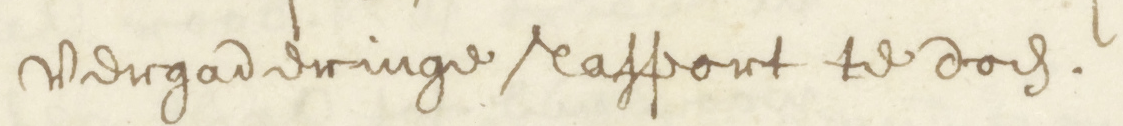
Vergaderinge rapport te doen.
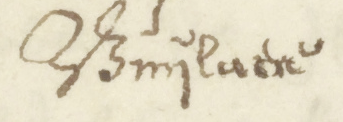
Buijlaere
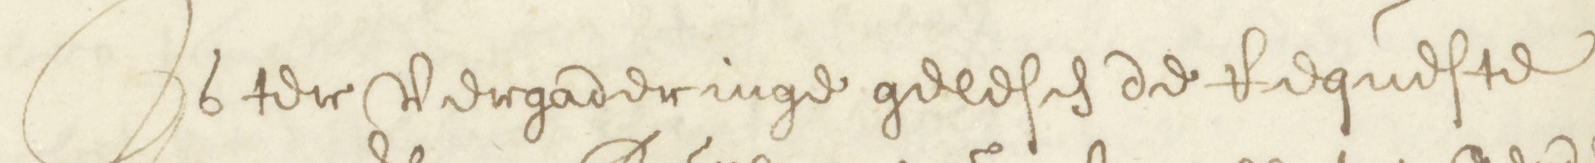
Is ter Vergaderinge gelesen de Requeste
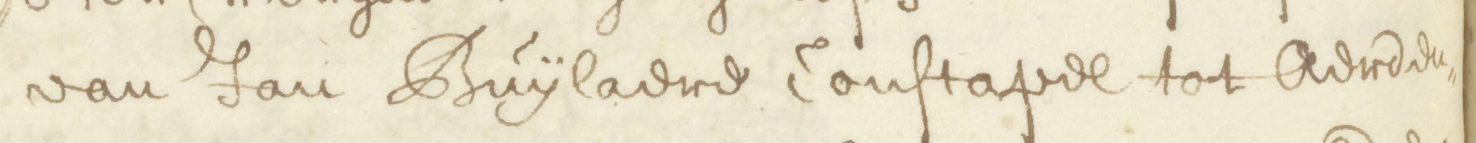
van Jan Buijlaere Constapel tot Aerden„
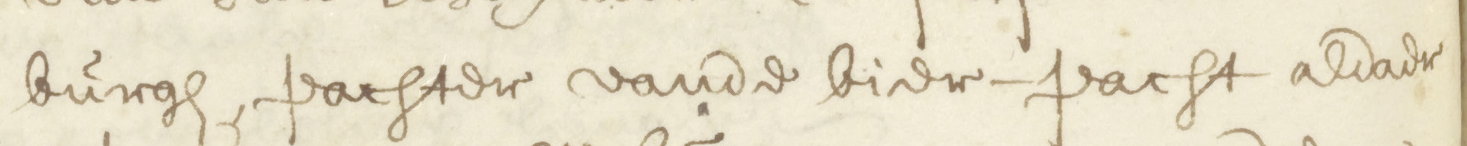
burgh, pachter vande bier-pacht aldaer
